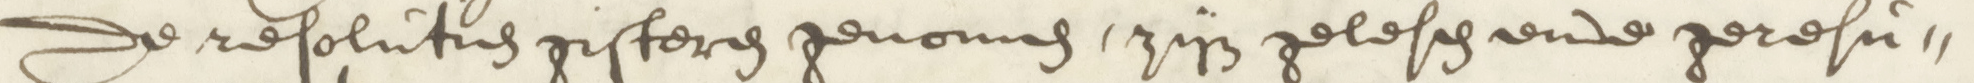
De resolutien gisteren genomen, zijn gelesen ende geresu„
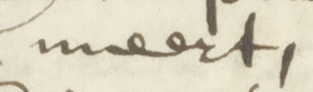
meert.
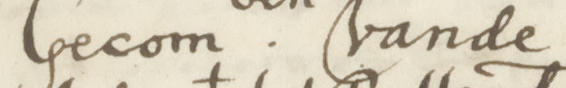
Gecomden. vande
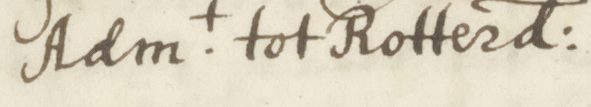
Admt. tot Rotterd:
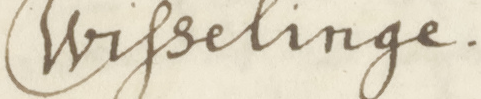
Wisselinge.
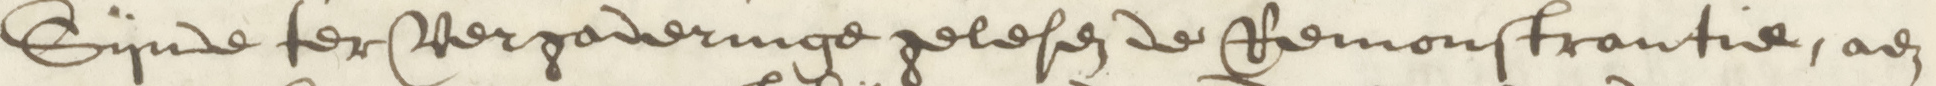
Sijnde ter Vergaderinge gelesen de Remonstrantie, aen
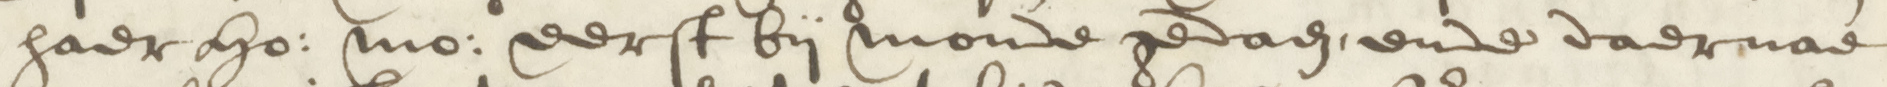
haer Ho:Mo: eerst bij monde gedaen, ende daernae
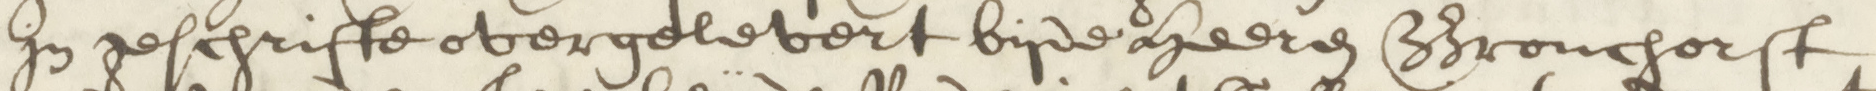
In geschrifte overgelevert bijde Heeren Brouchorst
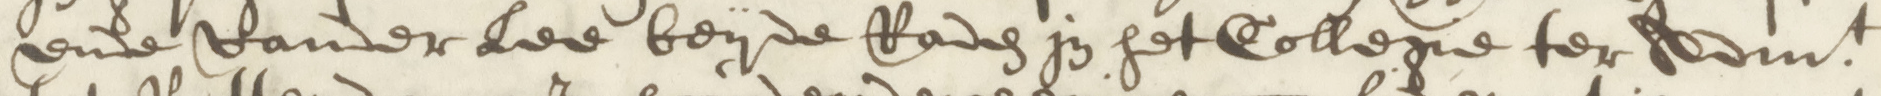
ende vander Lee beijde Raden in het Collegie ter Admt.
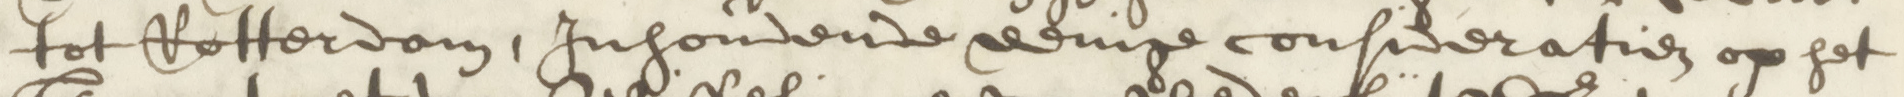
tot Rotterdam, Inhoudende eenige consideratien op het
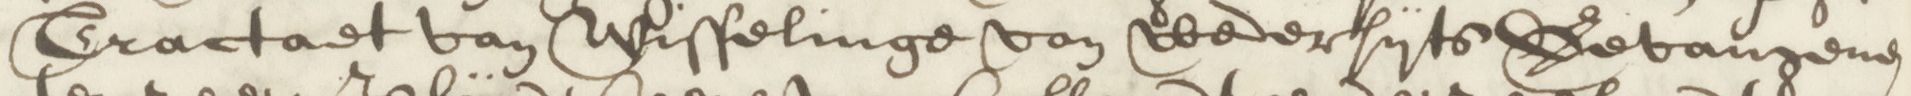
Tractaet van Wisselinge van wedersijts Gevangenen
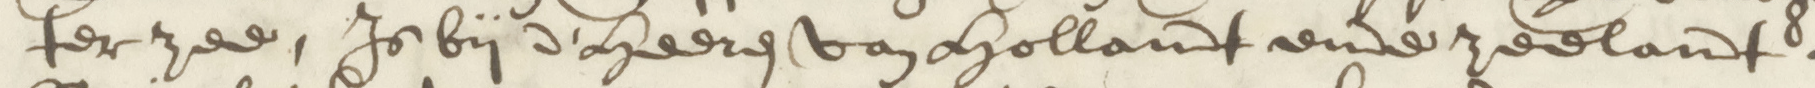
ter zee, Is bij d'Heeren van Hollant ende zeelandt —
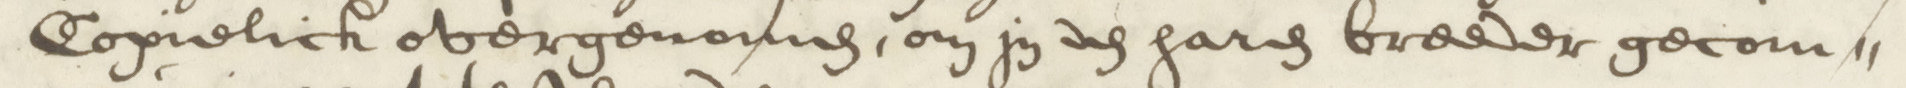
Copielick overgenomen, om in den haren breeder gecom„
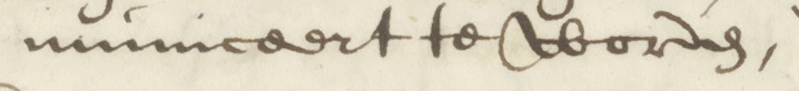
municeert te worden,
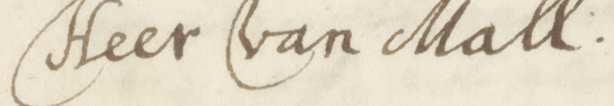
Heer van Mall.
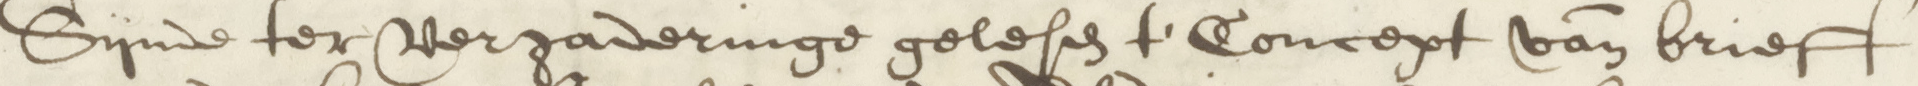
Sijnde ter Vergaderinge gelesen t'Concept van brieff
